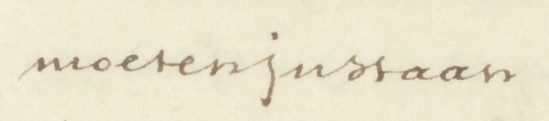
moeten instaan
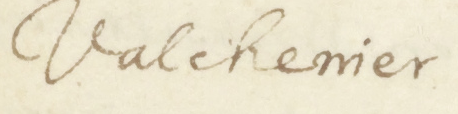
Valckenier
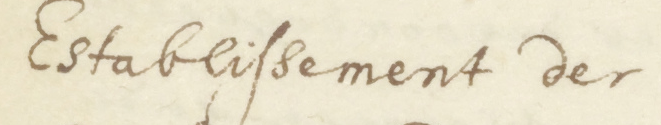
Establissement der
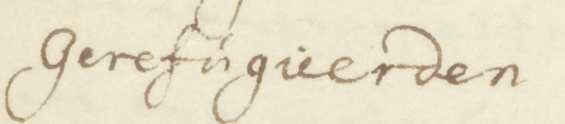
Gerefugeerden
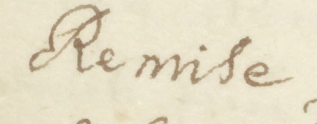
Remise,
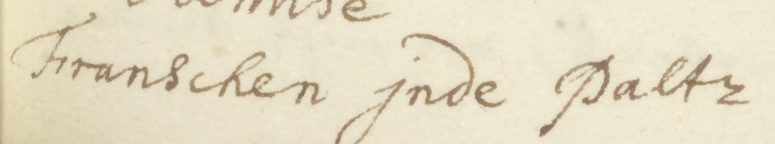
Franschen Inde Paltz
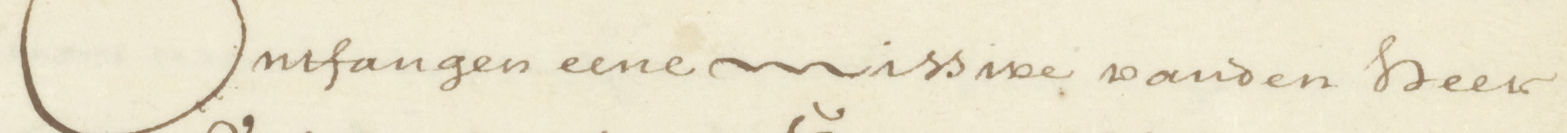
Ontfangen eene missive vanden Heer
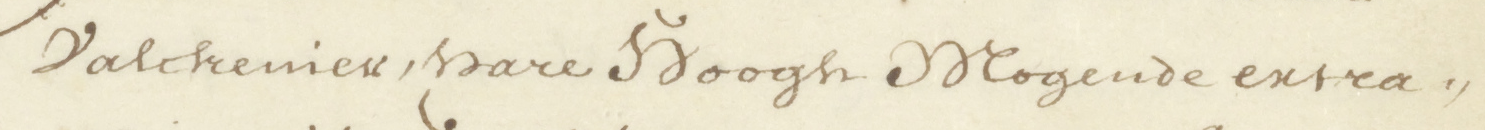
Valckenier, hare Hoogh Mogende extra„
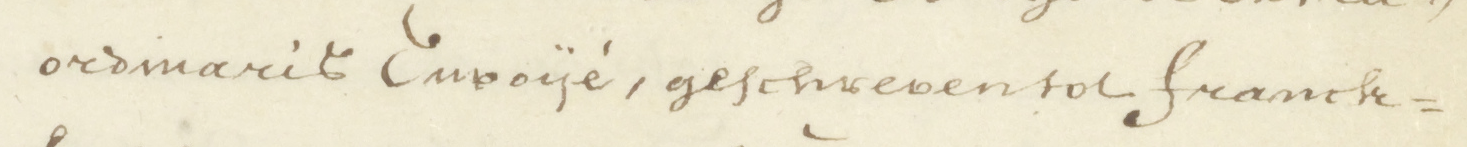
ordinaris Envoijé, geschreven tot Franck=
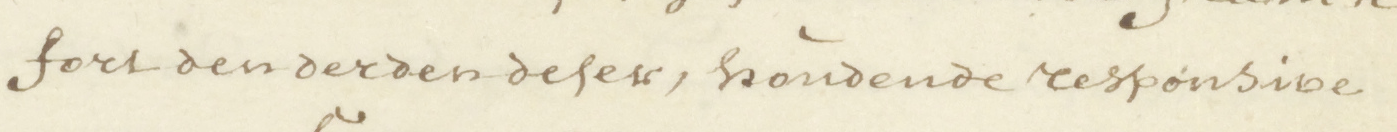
fort den derden deser, houdende responsive
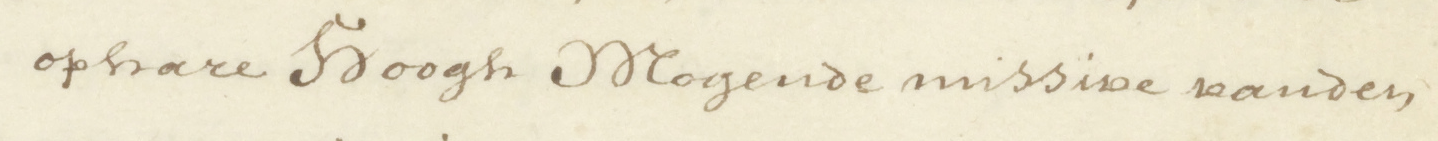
op hare Hoogh Mogende missive vanden
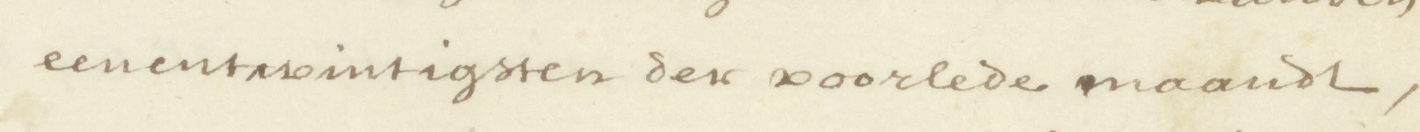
eenentwintigsten der voorlede maandt
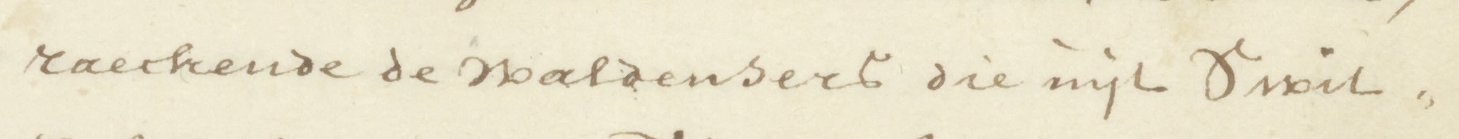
raeckende de Waldensers die uijt Swit„
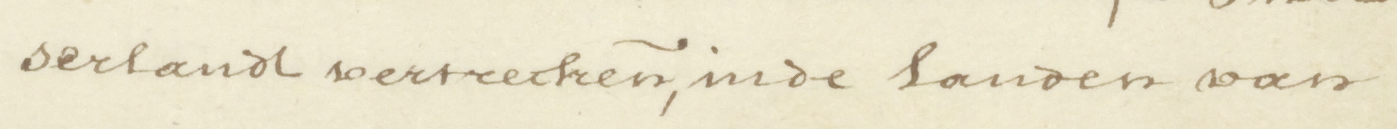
serlandt vertrecken inde landen van
